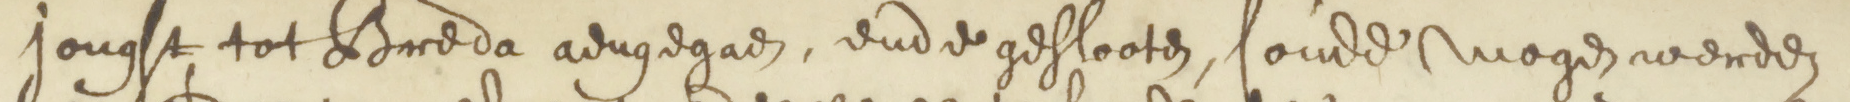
jongst tot Breda aengegaen, ende geslooten, soude mogen werden
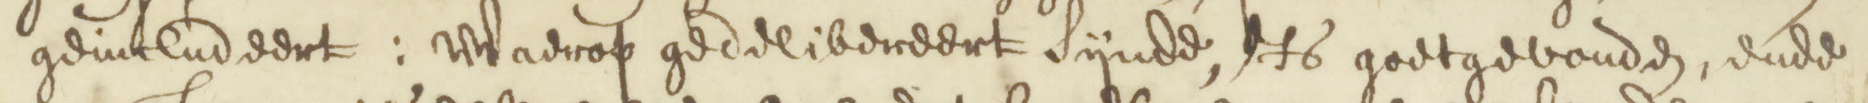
geincludeert: Waerop gedelibereert sijnde, Is goetgevonden, ende
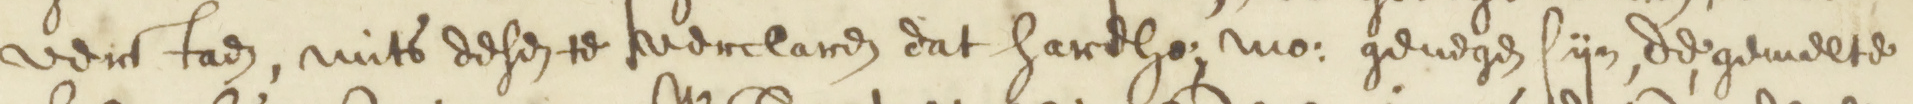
verstaen, mits desen te verclaren dat hare ho:mo: genegen sijn, de gemelte
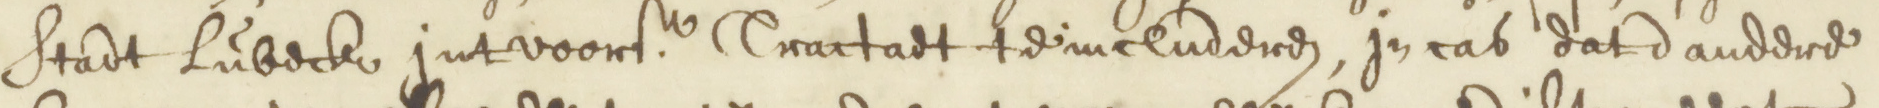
stadt Lubeck int voors. Tractaet te includeren, in cas dat d'andere
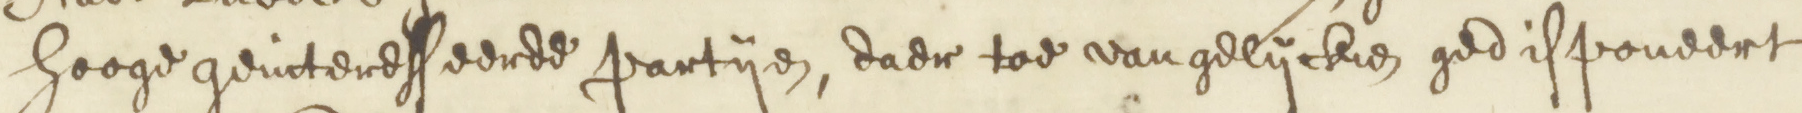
hooge geinteresseerde partijen, daer toe van gelijcken gedisponeert
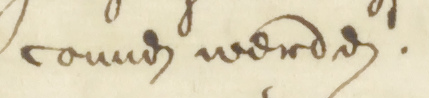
connen werden.
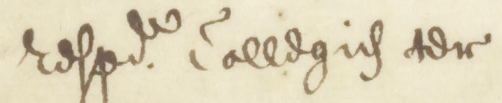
respve. Collegien ter
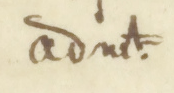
admt.
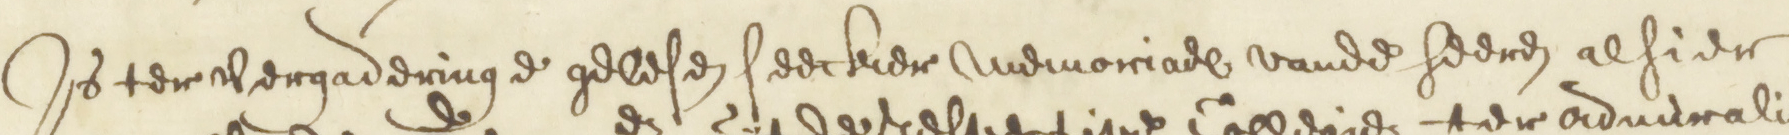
Is ter Vergaderinge gelesen seecker memoriael vande heeren alhier
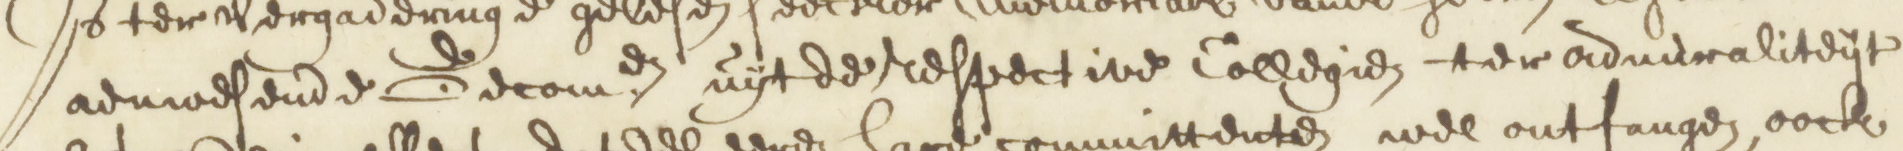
aenwesende Gecomen uijt de respective Collegien ter Admiraliteijt
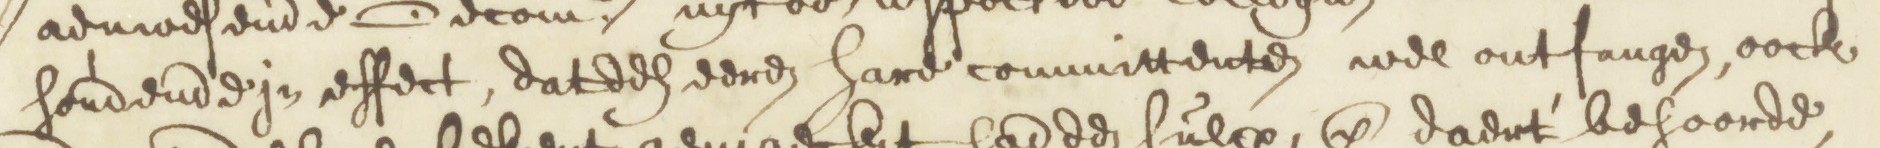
houdende in effect, dat de heeren hare committenten wel ontfangen, oock
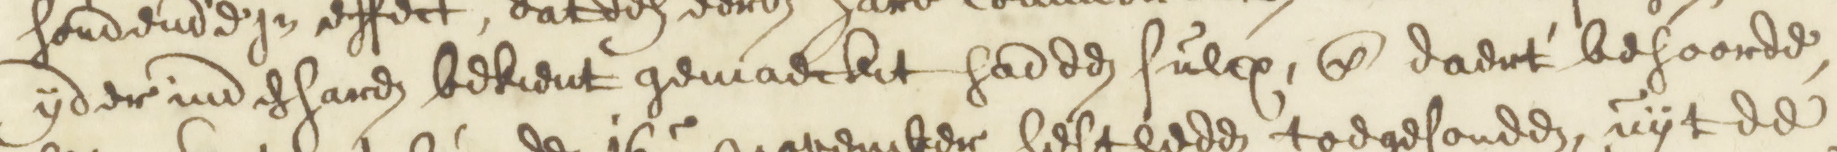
ijder inden haren bekent gemaeckt hadden sulcx, & daert‛ behoorde,
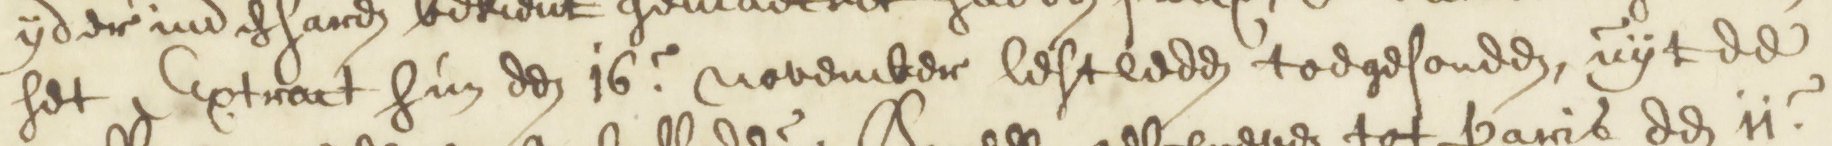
het, Extract hun den 16e. november lestleden toegesonden, uijt de
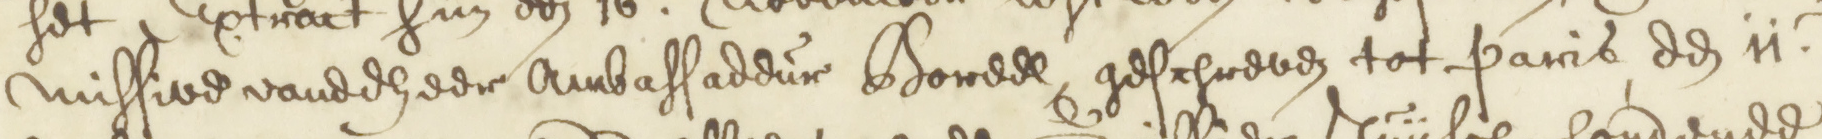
missive vande heer Ambassadeur Boreel, geschreven tot Paris den iie.
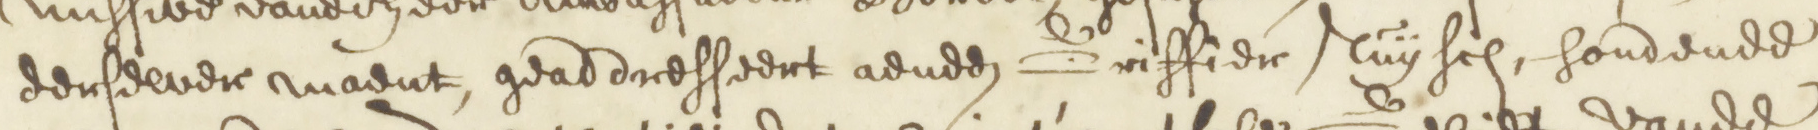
derselver maent, geaddresseert aenden Griffier Ruijsch, houdende
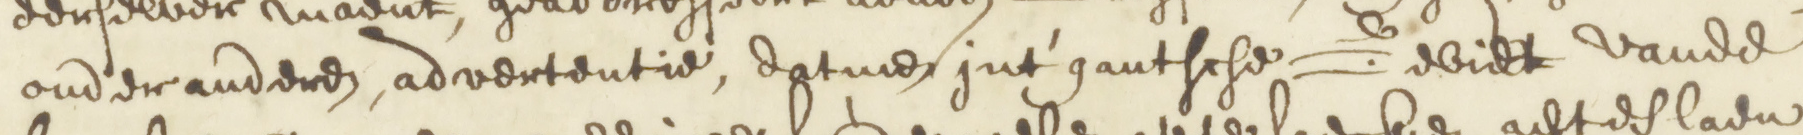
onder anderen, advertentie, datmen int‛ gantsche Gebiet vande
